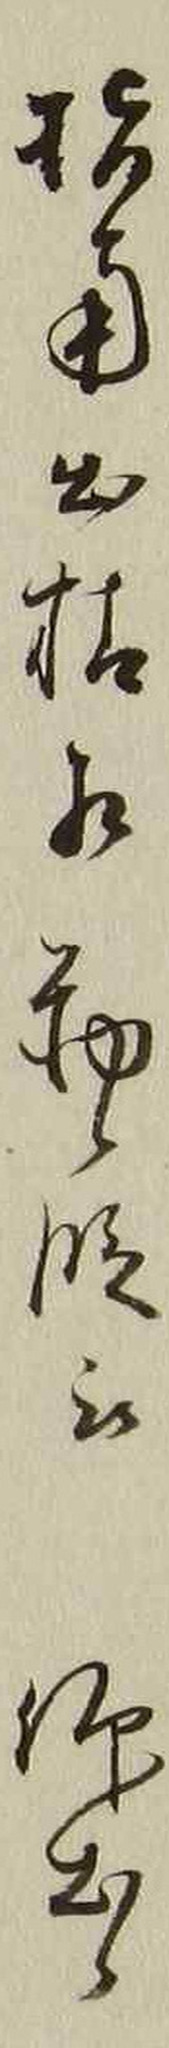指南出精相勤候段被仰出候
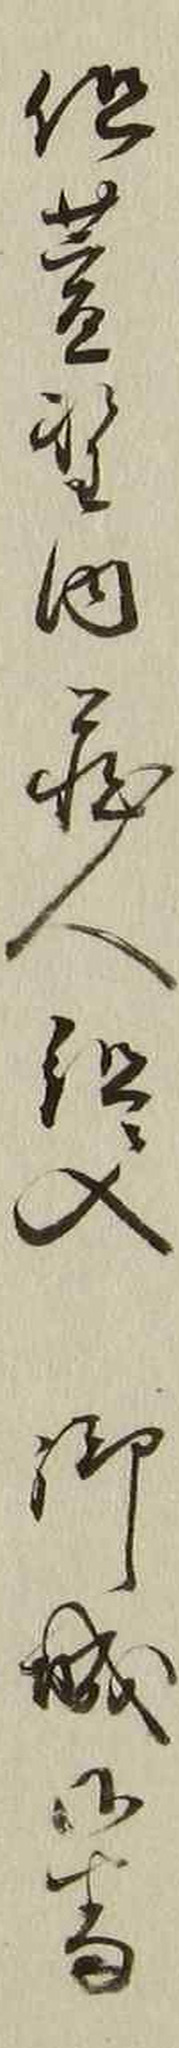但萱野内蔵人組ニ入御城御番
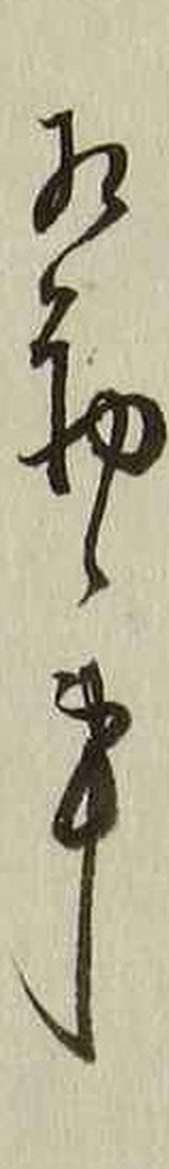相勤候事
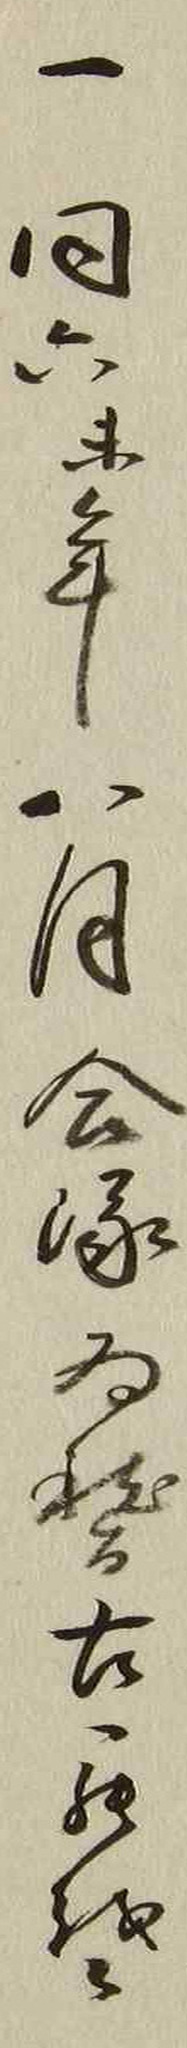一同六未年八月合隊為稽古罷越候
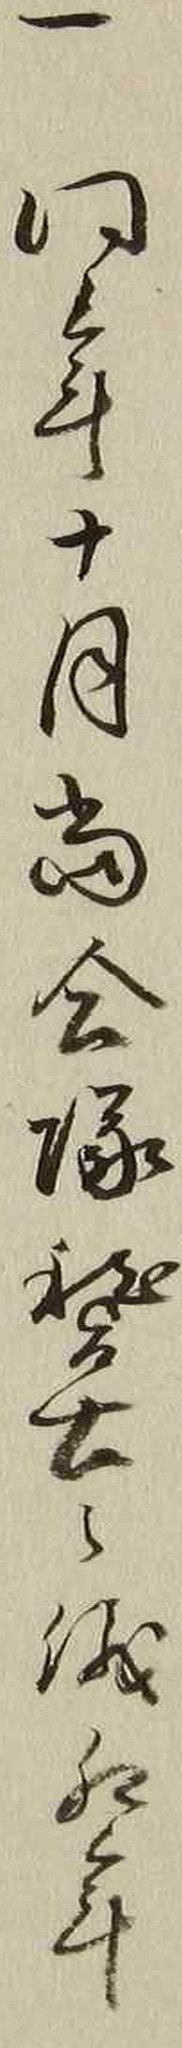一同年十月当合隊稽古之儀卯年
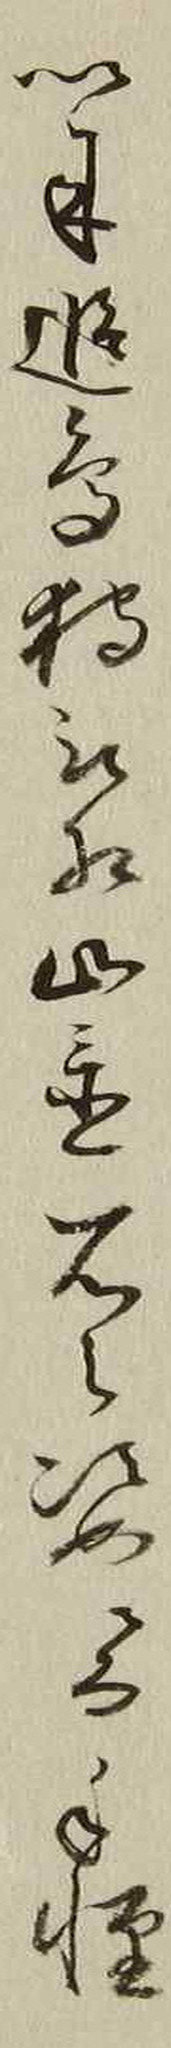以来追鳥狩被相止置右之姿ニ而手軽
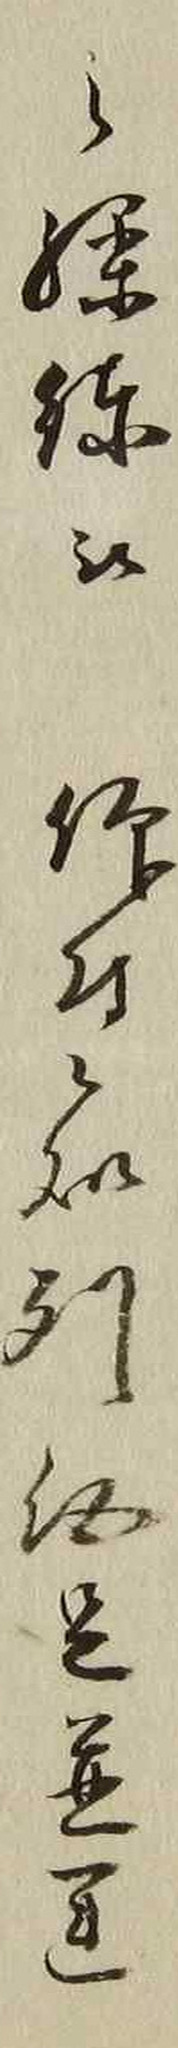之繰練被仰付候処列伍足並運
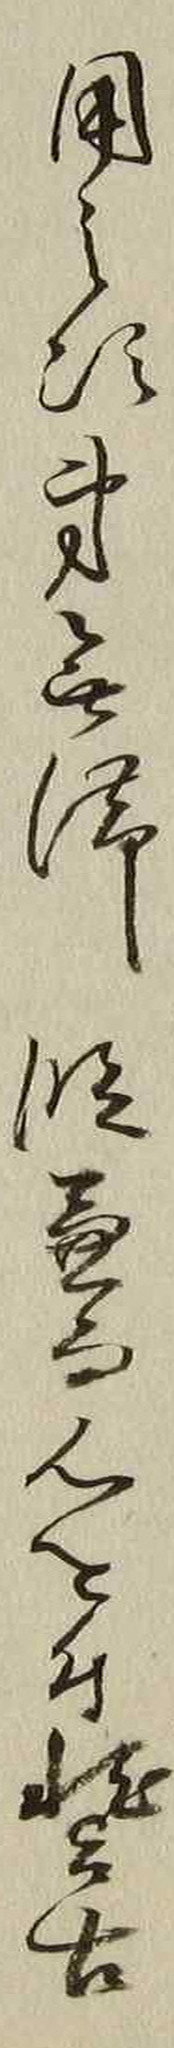用之次第無滞段兼而心を付稽古
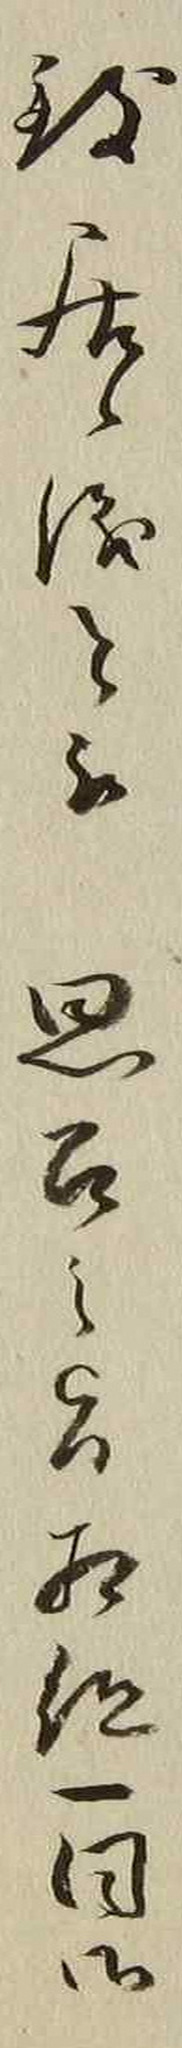致居候儀と被思召之旨相組一同御
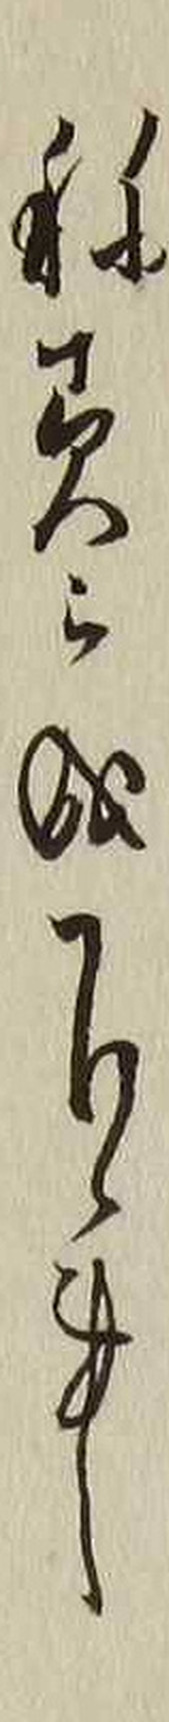称美被成下候事
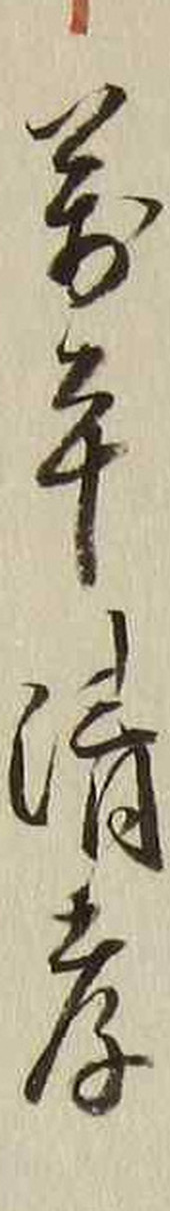万平清孝
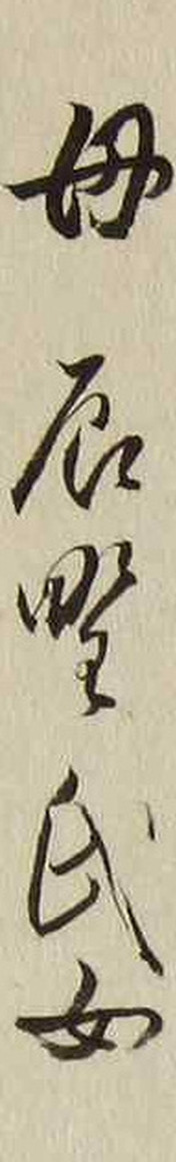母辰野氏女
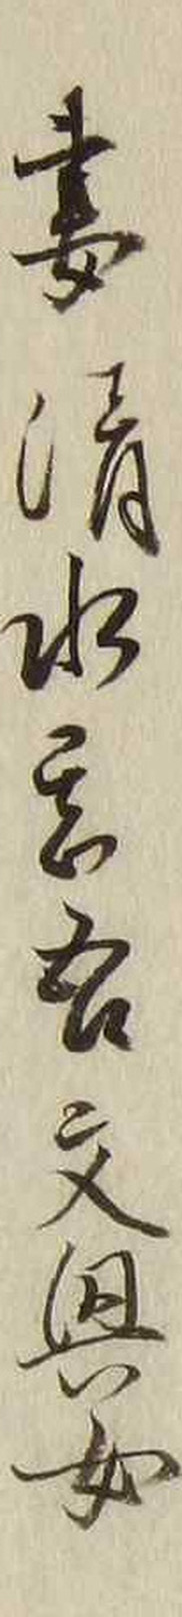妻清水甚吾文興女

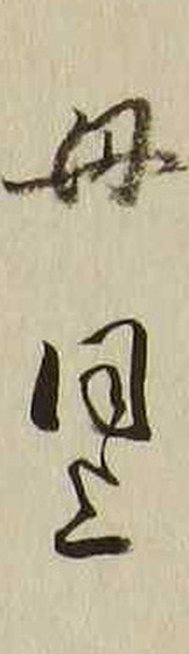母同上
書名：諸士系譜　巻之28　い之部28
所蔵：会津若松市立会津図書館
